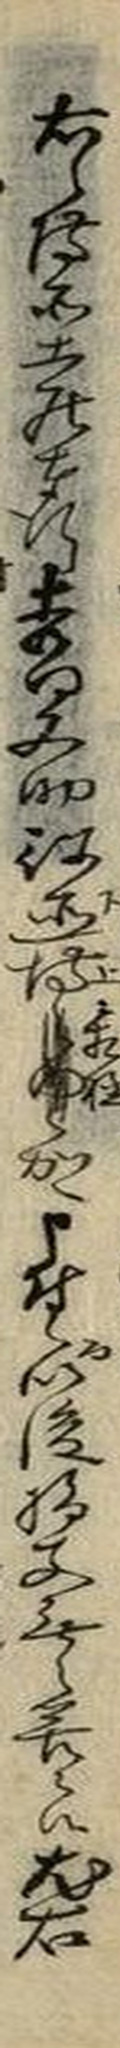右の場所土居奉行吉田又助役場所に相極加へ申付る以後指支無之筈に候尤右
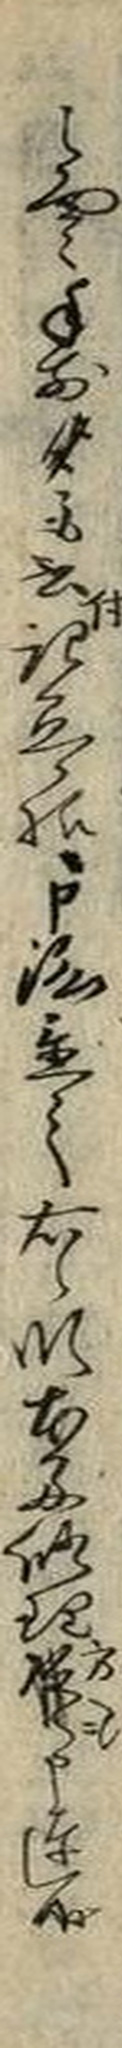之面々手前にも書付記置候様に申渡置之右之段本多修理方へも申達候
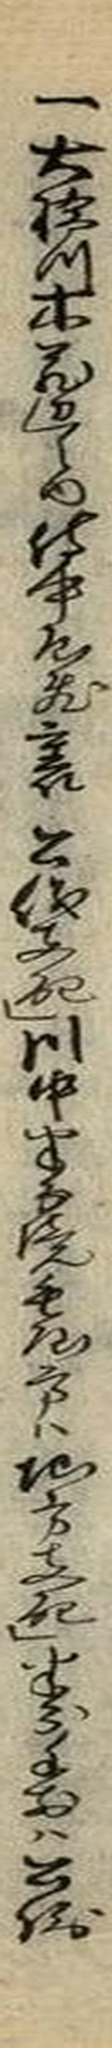一大橋川木蔵辺之内侍中屋敷裏公儀支配」川中半分境毛屋方は地方支配」半分手前は公儀
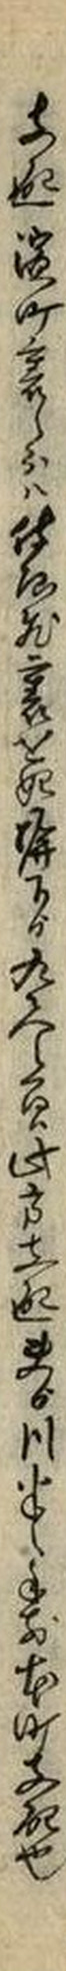支配」浜町裏之分は侍屋敷裏を始塀下ゟ九尺之間は此方支配」夫ゟ川半之手前本町支配也
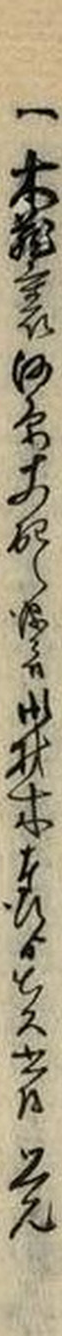一木蔵裏河原支配之儀に付御材木奉行ゟ出ス書付覚
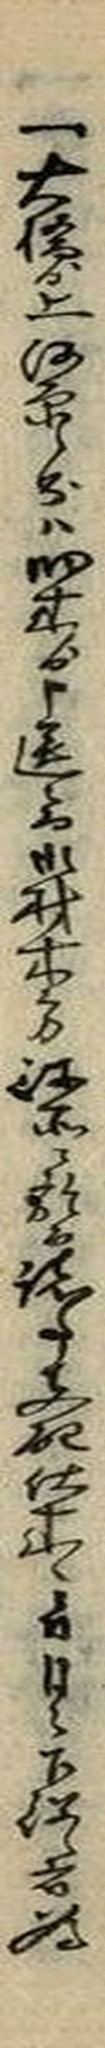一大橋ゟ上河原之分は旧来ゟ申送候て御材木方役所に於て諸事支配仕来候に付月々下役之者為
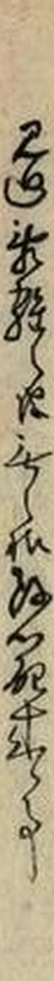見廻乱難之儀無之様致心配来候事
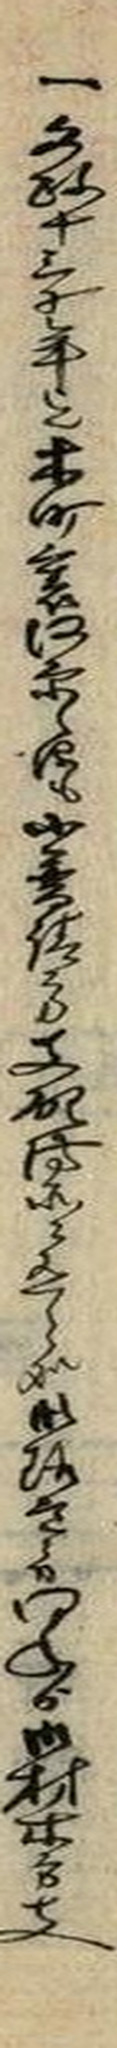一文政十三刁年迄木町裏河原之儀も小普請方支配場所に有之候処御趣意に付同年ゟ御材木方支
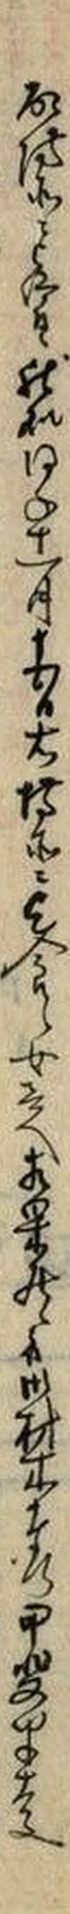配場所に被仰付候然処同年十一月十五日右場所に乞食之女壱人相果居候に付御材木奉行甲斐半大夫
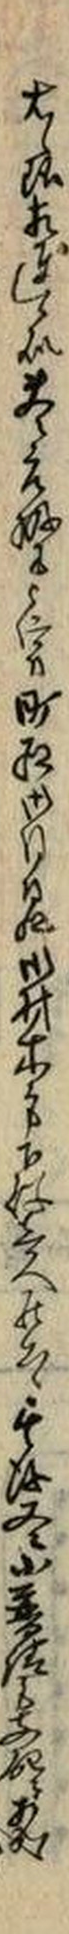右之趣相達候処夫々取扱に被仰付町組御目付組御材木方下役壱人罷出候其後又々小普請方支配に相成候事
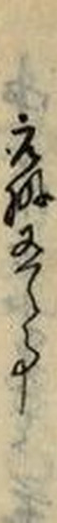取扱有之事
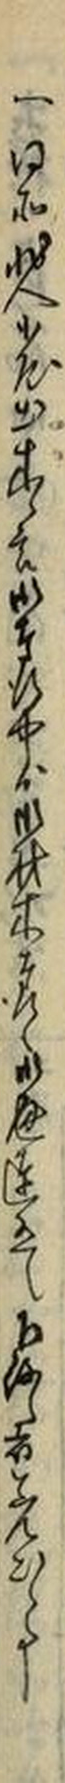一同所非人小屋出来候節御奉行中ゟ御材木奉行へ御通達有之下役之者差出候事
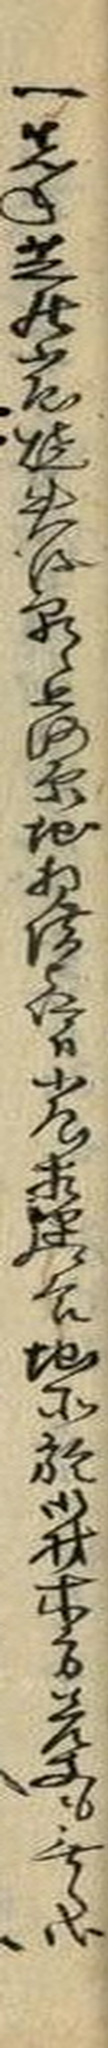一先年芝居小屋焼失之儀願之上河原地拝借被仰付小屋相建候節地所於御材木方差支も無之哉
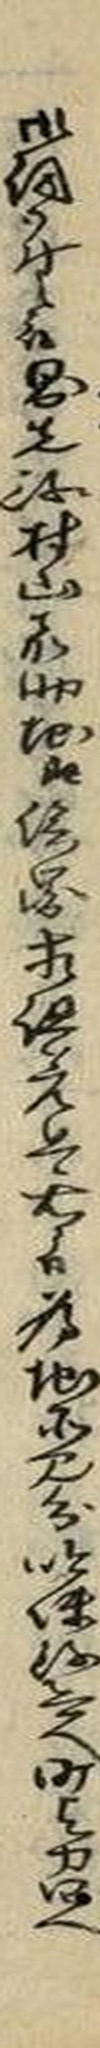御調御座候に付則先役村山嘉助地の絵図相認差上候右に付為地所見分吟味役壱人町与力四人
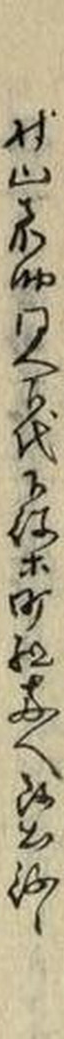村山嘉助同人下代下役等町組両人致出役候
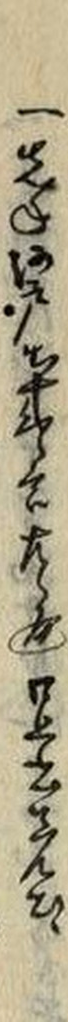一先年河戸出来候節左之通口上書差出候
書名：御城下諸事之部
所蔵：福井県文書館 Fukui Prefectural Archives
